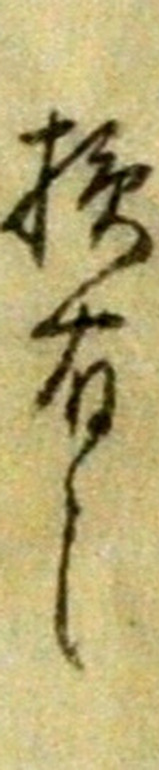損有之
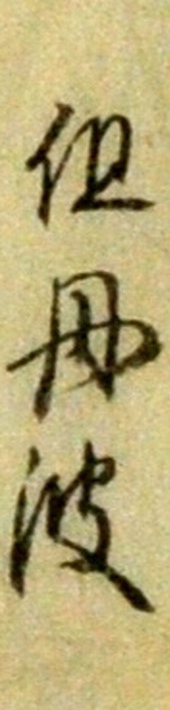但丹波
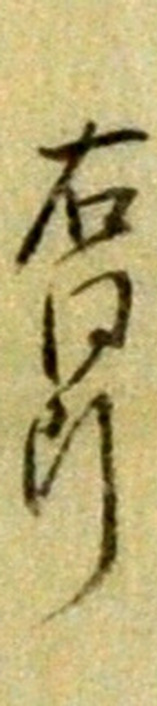右同断
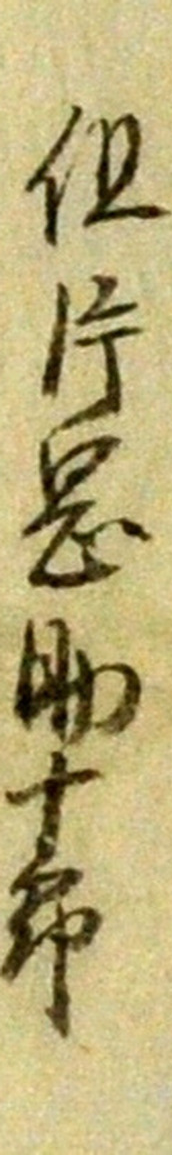但片岡助十郎
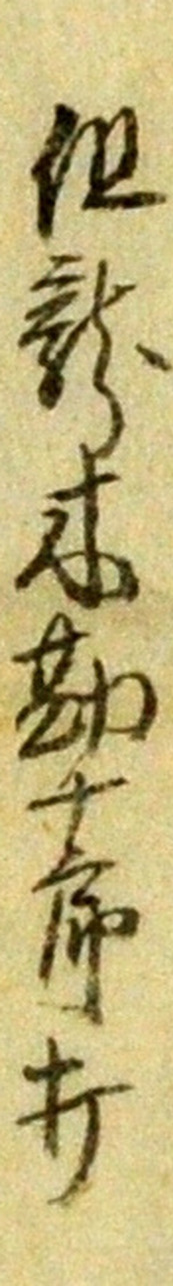但龍木勘十郎打
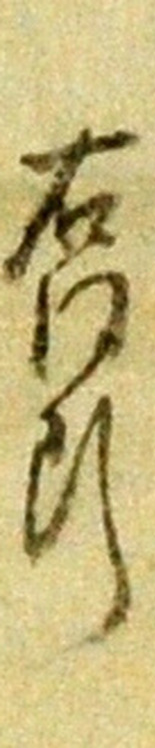右同断
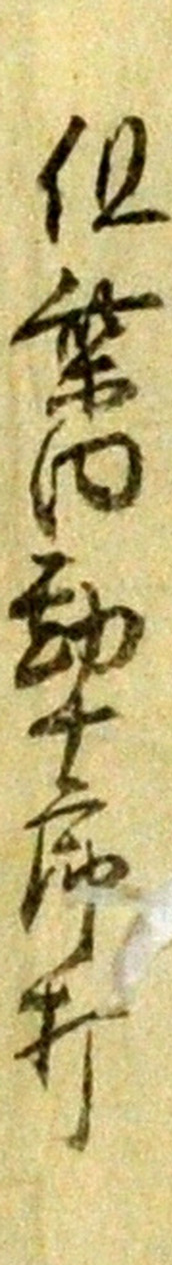但柴田勘十郎打
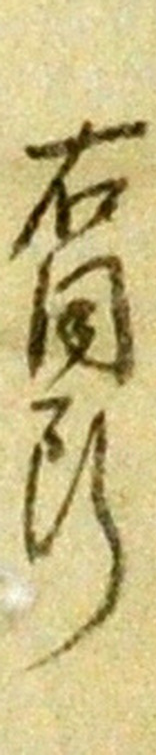右同断
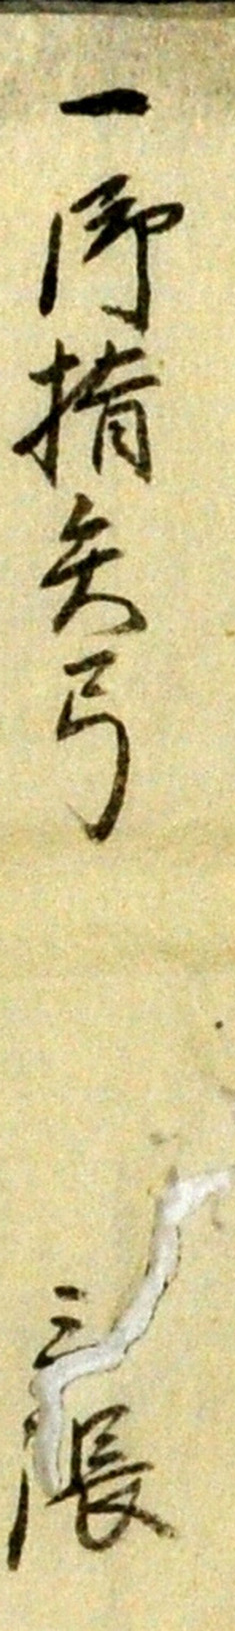一御指矢弓三張
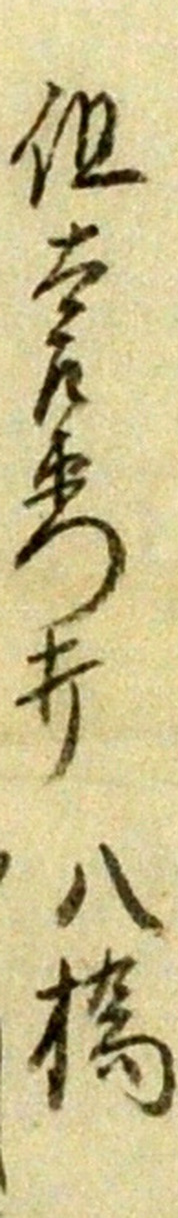但太左衛門打八橋
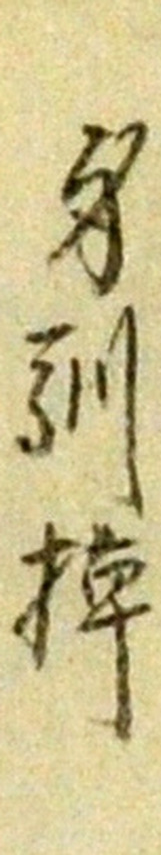身馴枠
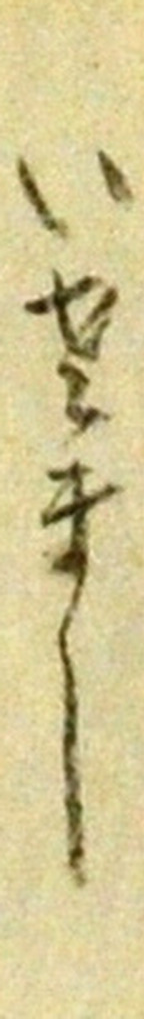いさまし
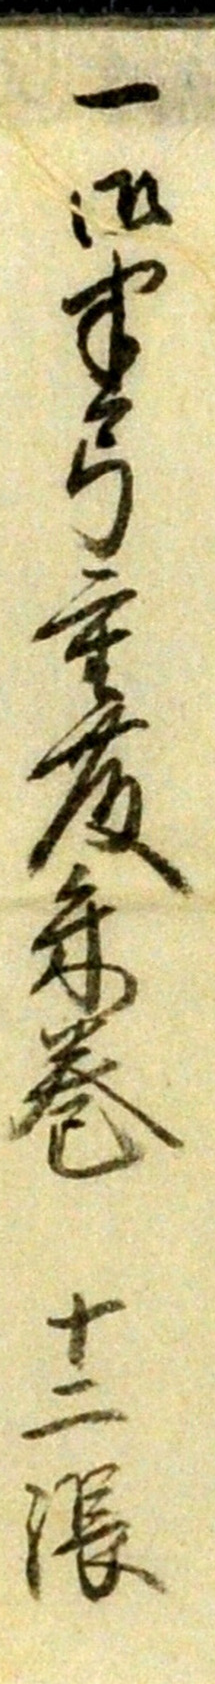一御半弓重藤朱巻十二張
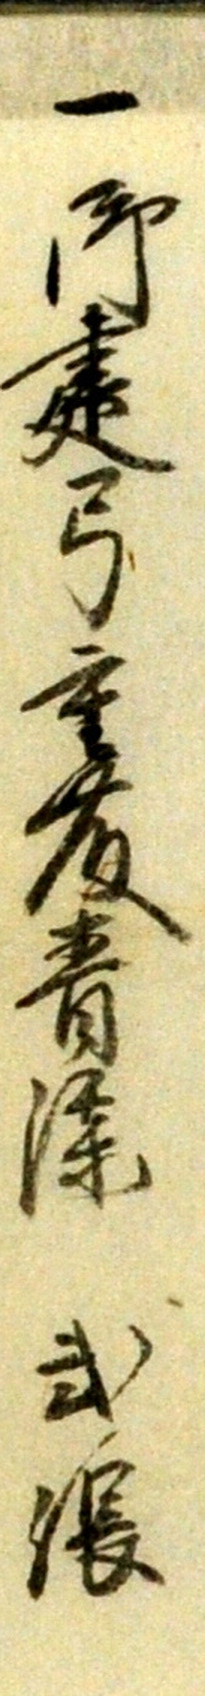一御建弓重藤青漆弐張
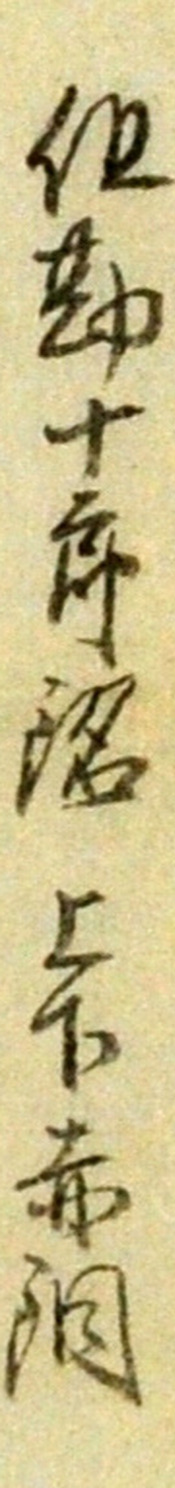但勘十郎銘上下赤銅
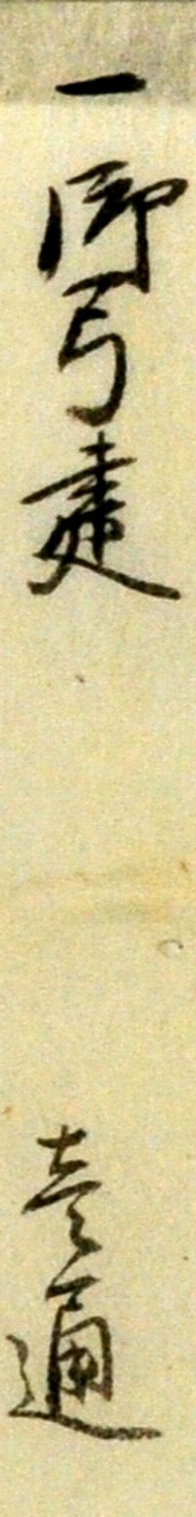一御弓壱張
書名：目録
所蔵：伊那市立高遠町図書館・合同会社AMANE
